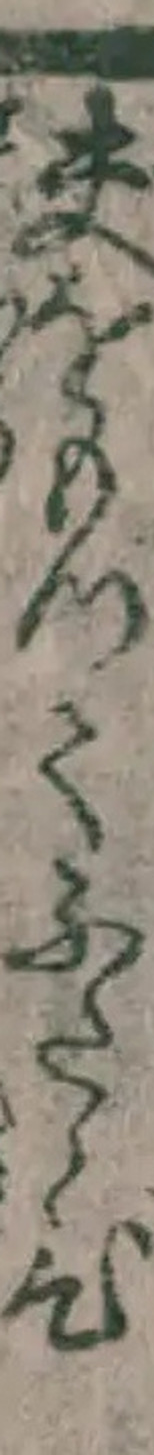夫をもつてふたゝび
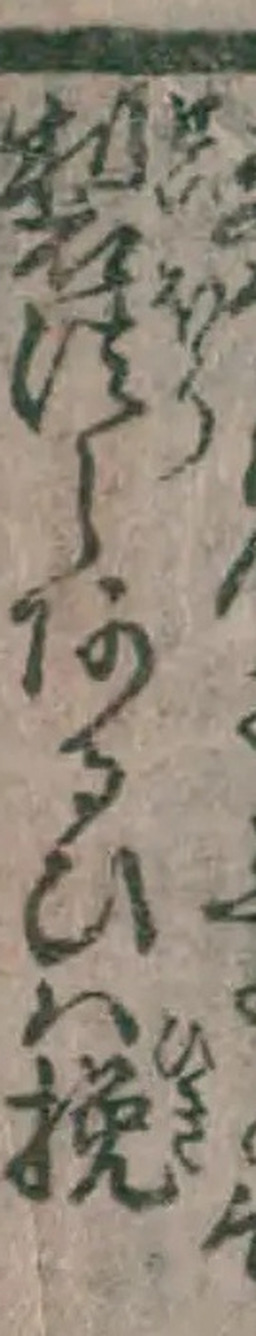製法しあるひは挽
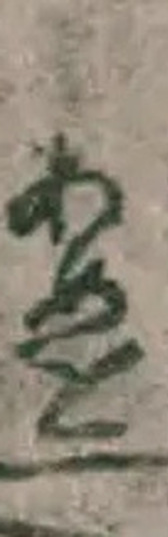あめを
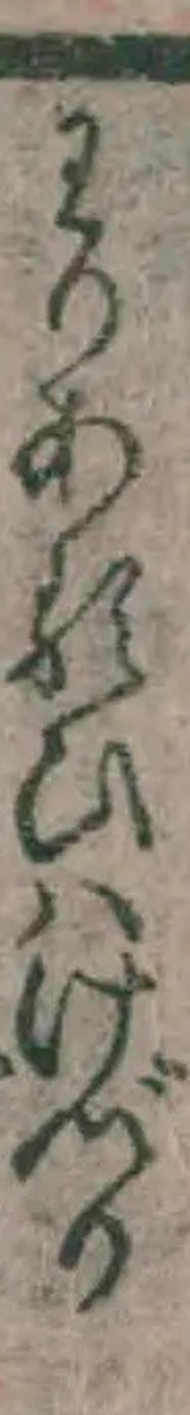わりあるひはけづり
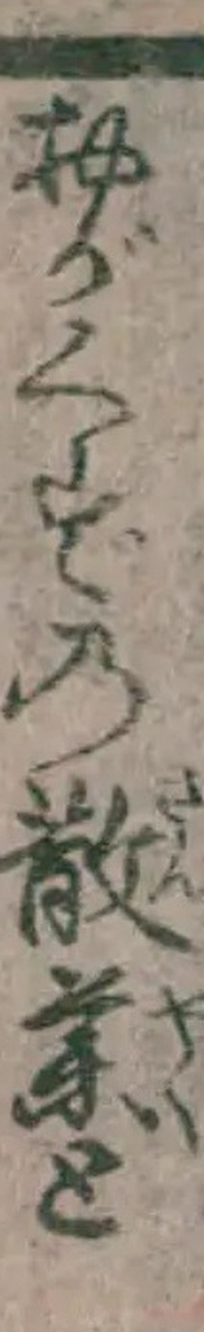おがくずの散薬と
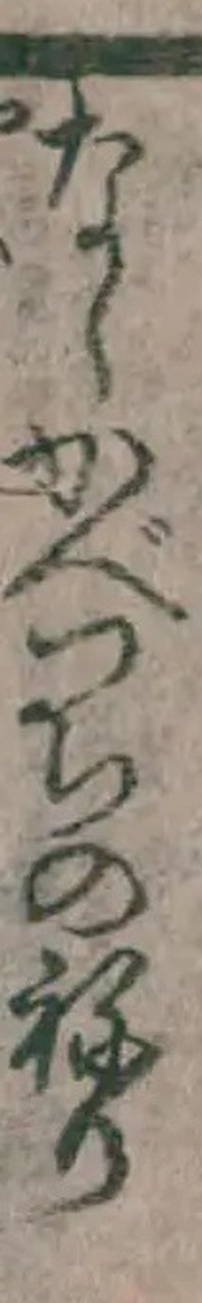なしすべつちのねり
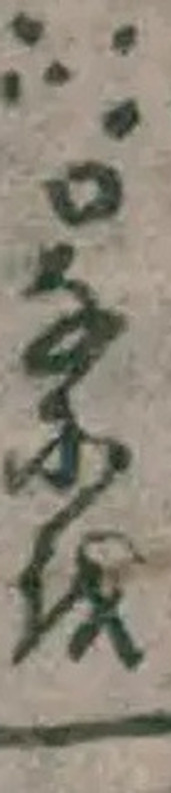○なにを
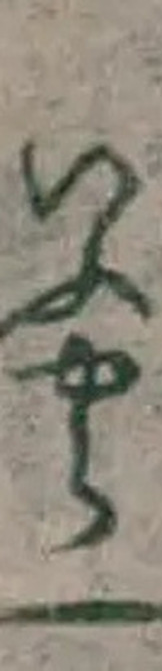いふやら
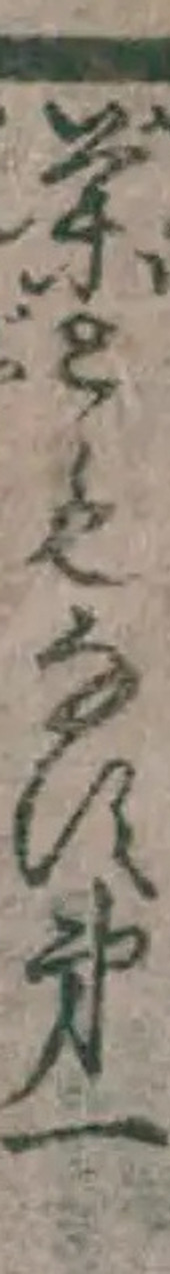薬ともなす第一
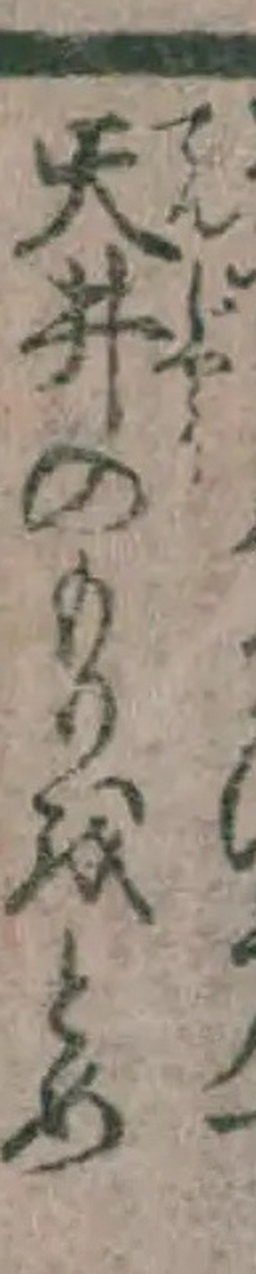天上のものをとめ
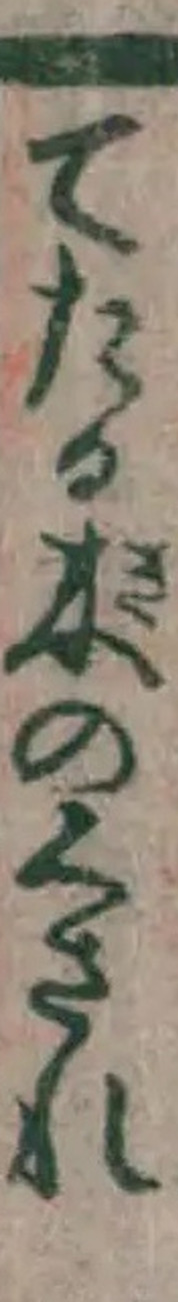てたる木のくされ
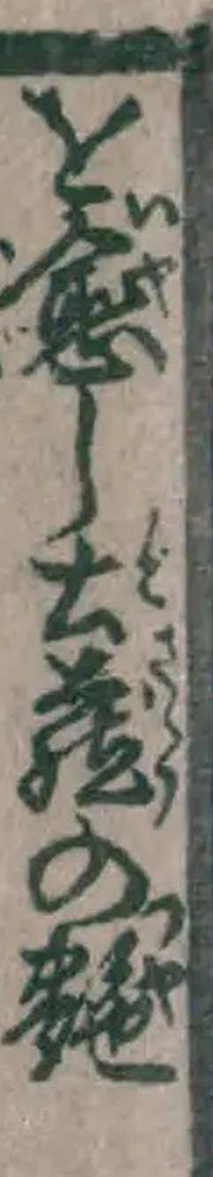を愈し土蔵の艶
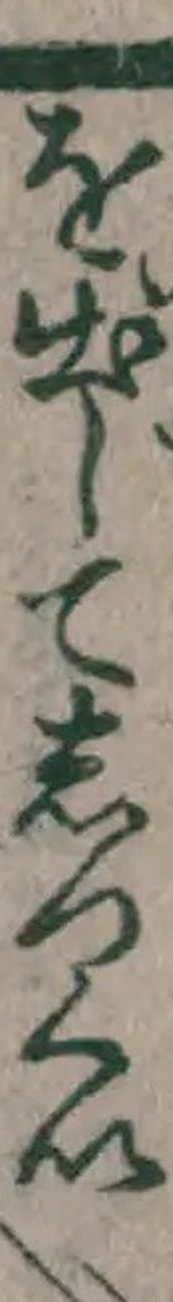を出してしつくい
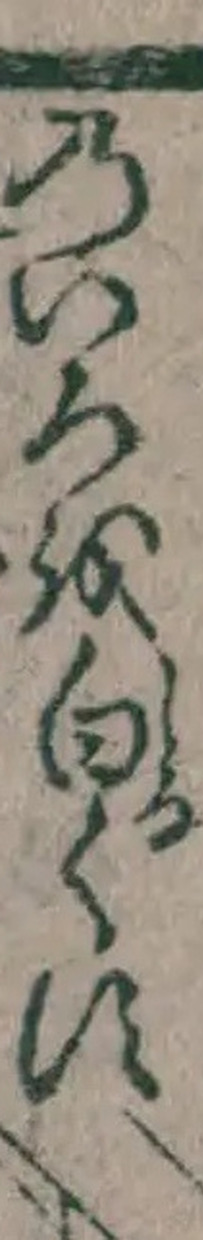のいろを白くす
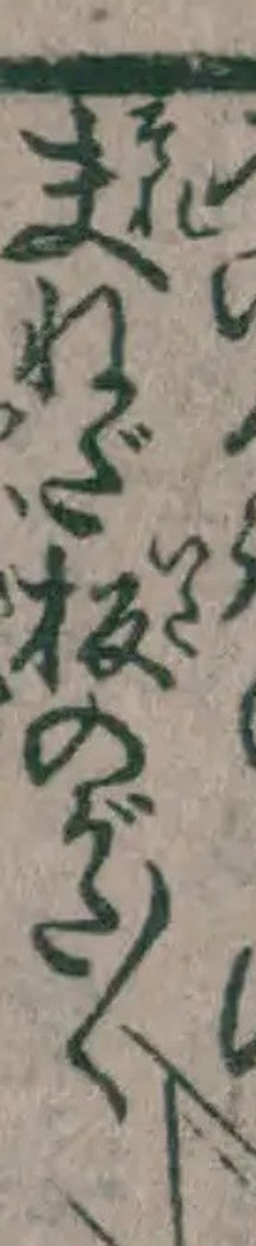夫ねだ板のがた〳〵
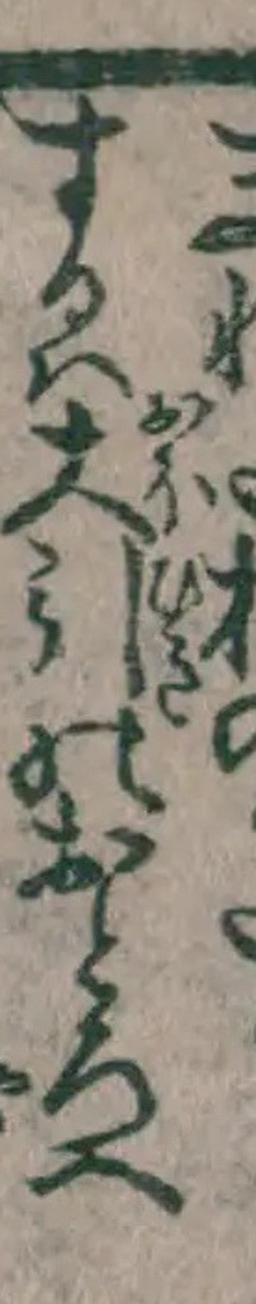するは大引のおとろへ
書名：視薬霞報条 3巻
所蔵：国立国会図書館 National Diet Library, JAPAN
